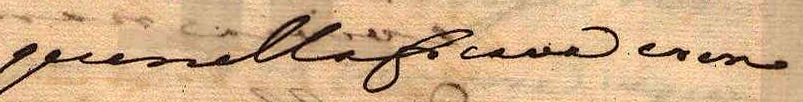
que nella ficava cren
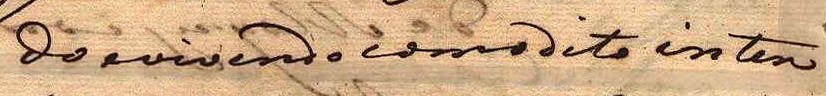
do e vivendo com o dito inten
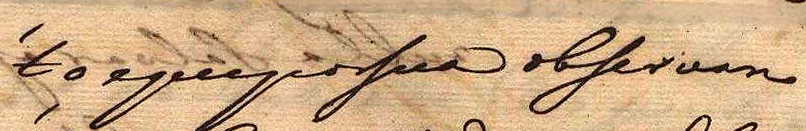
to, e que por sua observan
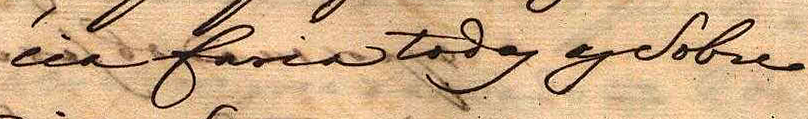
cia faria todas as Sobre
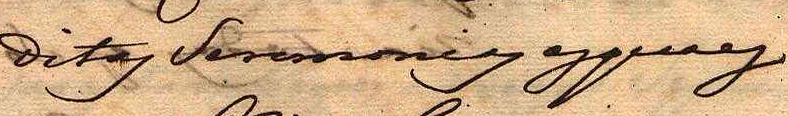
ditas Seremonias as quaes
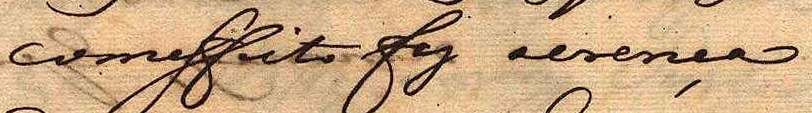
com effeito fas a crença
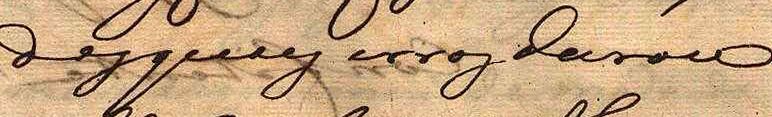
dos quaes erros durou
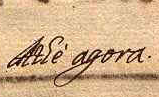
Athé agora.
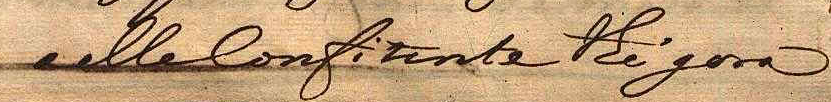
e ele Confitente thé gora
